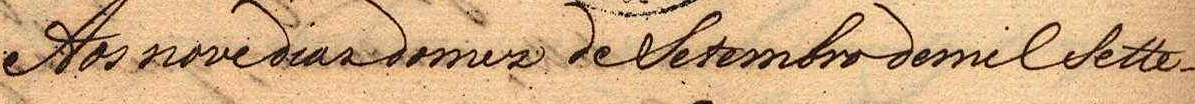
Aos nove diaz do mez de Setembro de mil Sette
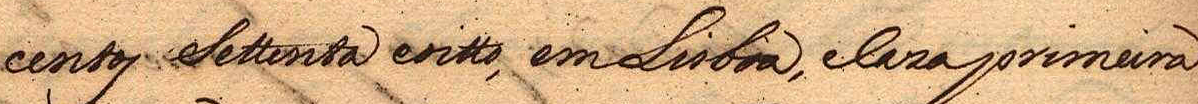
centos Settenta e oito, em Lisboa, e Caza primeira
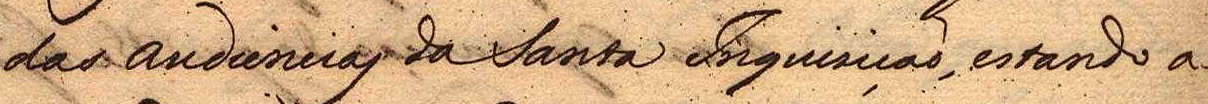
das audiencias da Santa Inquisiçaõ, estando a
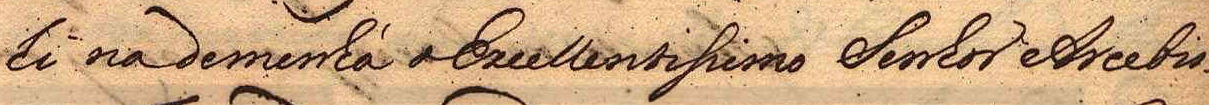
hi na de menhã o Excellentissimo Senhor Arcebis
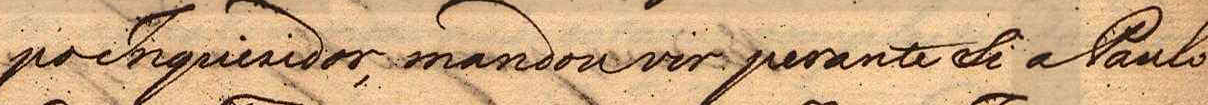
po Inquisidor, mandou vir perante Si a Paulo
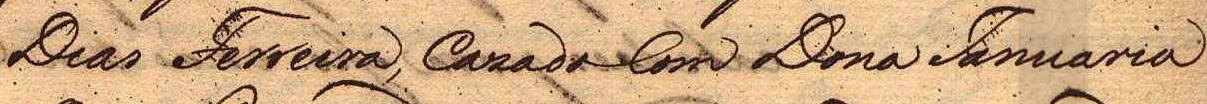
Dias Ferreira, Cazado Com Dona Ianuaria
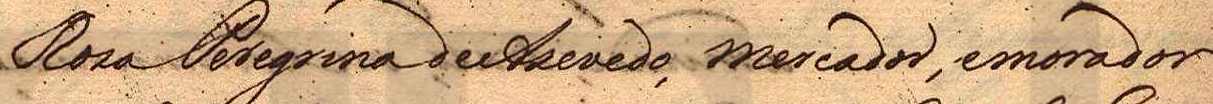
Roza Peregrina de Azevedo, mercador, e morador
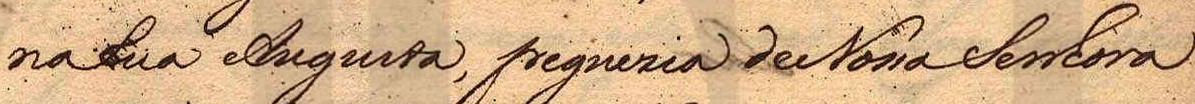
na Rua Augusta, freguezia de Nossa Senhora
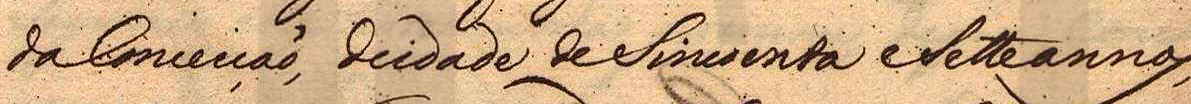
da Conceiçaõ, de idade de Sincoenta e Sette annos,
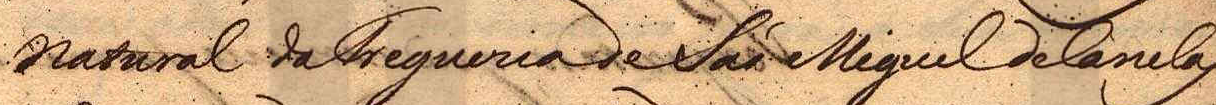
natural da Freguezia de Saõ Miguel de Canelas
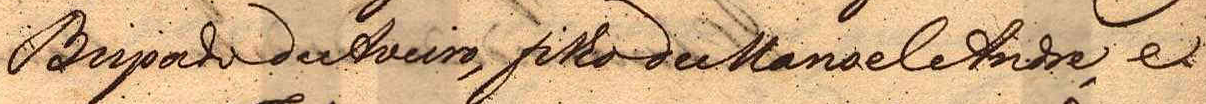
Bispado de Aveiro, filho de Manoel Andre, e
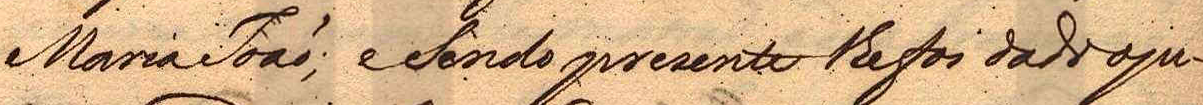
Maria Ioaõ; e Sendo presente lhe foi dado o ju
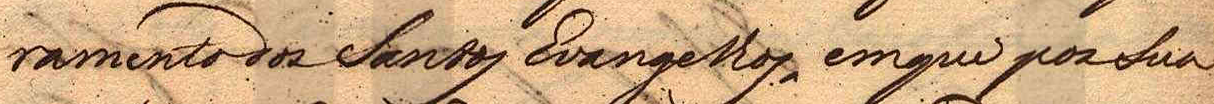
ramento dos Santos Evangelhos, em que pos Sua
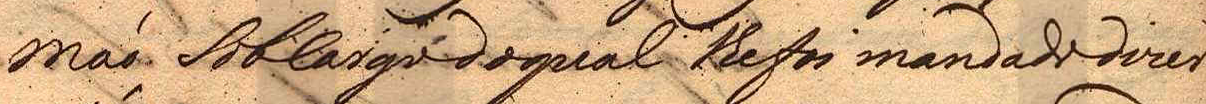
maõ sobCargo do qual lhe foi mandado dizer
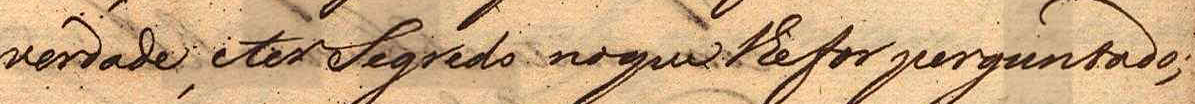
verdade, e ter Segredo no que lhe for perguntado;
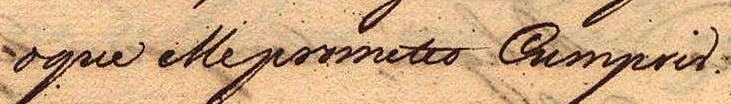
o que elle prometeo Cumprir.
